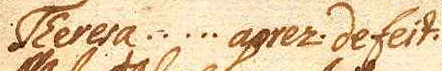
Theresa . . . . . aprez. de feit.
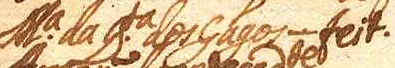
M.a da q.ta dos Gagos - feit.
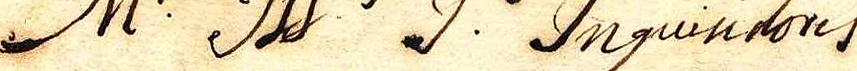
M.to Ill̄.es S.rs Inquisidores
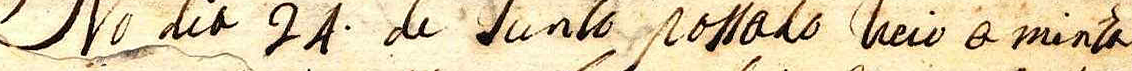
No dia 24. de Iunho passado veio a minha
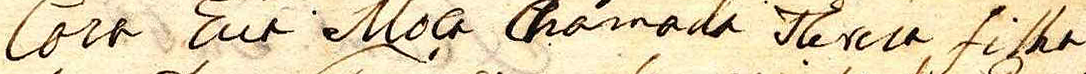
Caza huā Moça Chamada Thereza filha
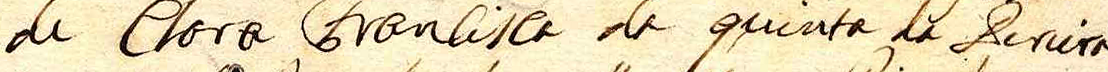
de Clara Francisca da quinta da Pereira
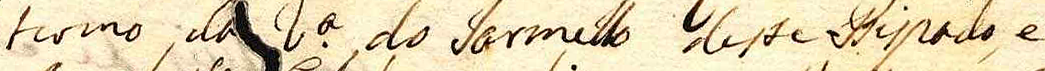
termo da V.a do Iarmello deste Bispado, e
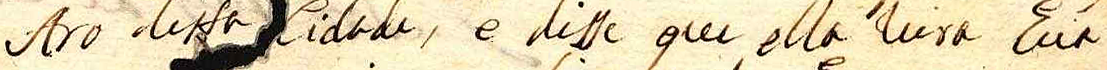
Aro desta Cidade, e disse que ella vira huā
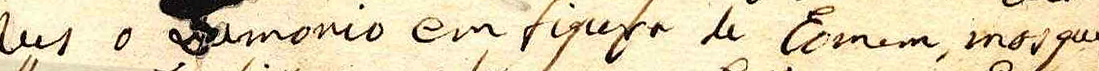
ves o D_monio em figura de homem, mas que
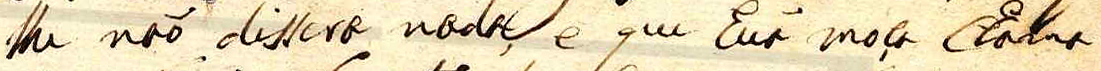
lhe naõ dissera nada, e que huā moça Chama
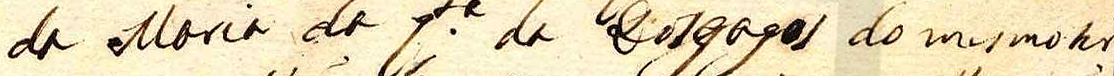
da Maria da q.ta da Dos gagos do mesmo ter
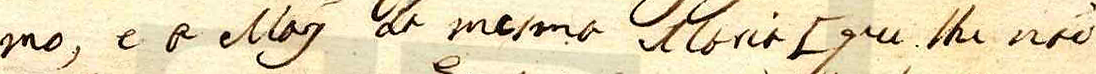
mo, e a Maỹ da mesma Maria [que lhe naõ
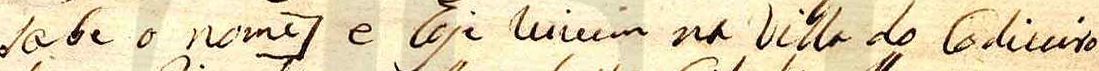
sabe o nome] e hoje uiuem na Villa do Codiceiro
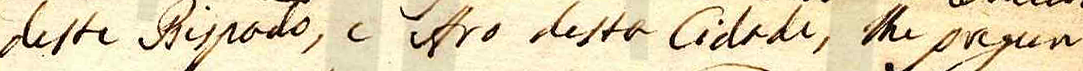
deste Bispado, e Aro desta Cidade, lhe pregun
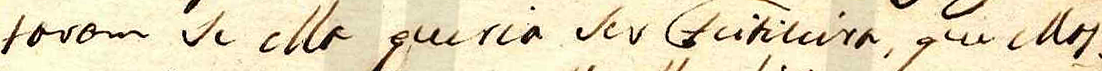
taram se ella queria ser Feiticeira, que ellas
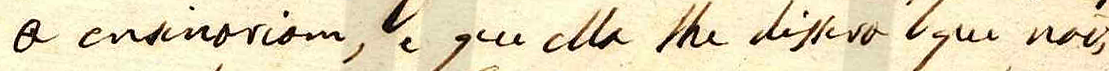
a ensinariam, e que ella lhe dissera que naõ,
